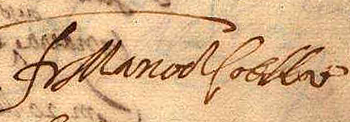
Fr Manoel Coelho
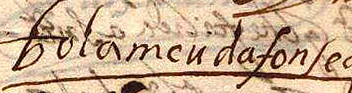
b̄olameu da fonseqa
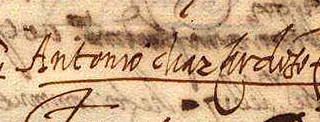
Antonio diaz Cardoso
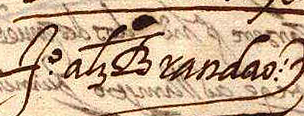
J.o al̄z Brandaõ
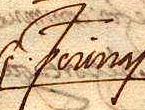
pereira
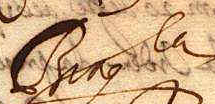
Bragça
